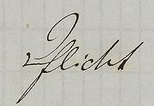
Pflicht
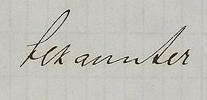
wir am Ende
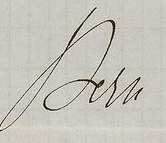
ein
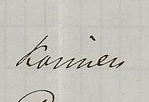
Resultat
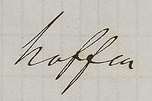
hoffen.
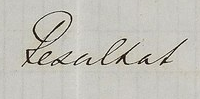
bekannter
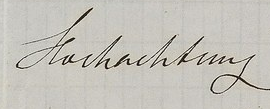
Hochachtung
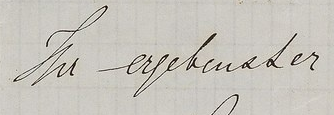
Ihr ergebenster
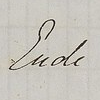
Bern
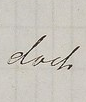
1. Febr.
